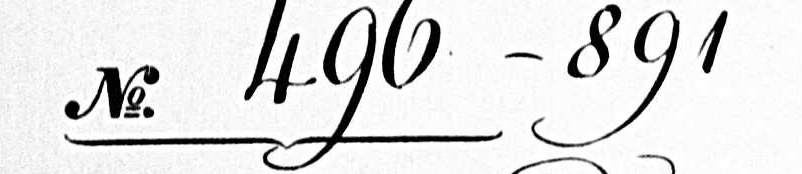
No. 496 – 1891
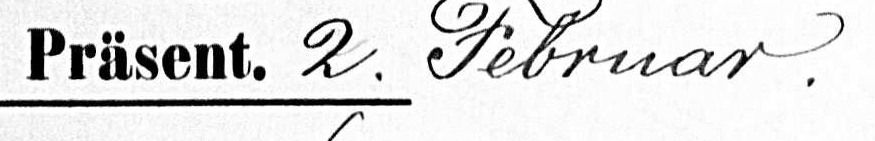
Präsent. 2. Februar
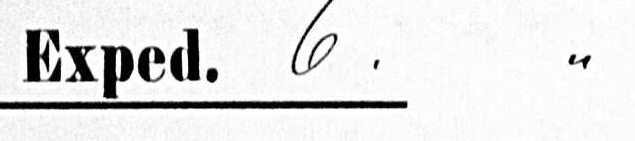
Expedit 6. Februar
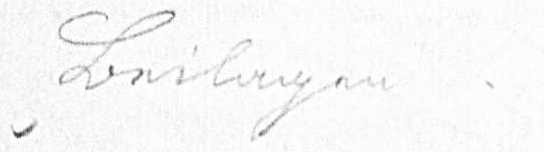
Beilagen
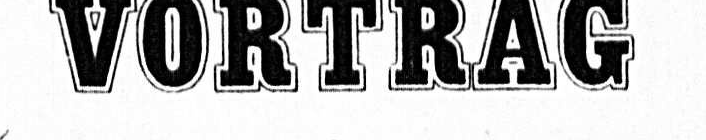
VORTRAG
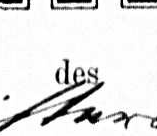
Des
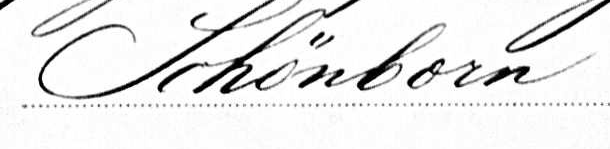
Schönborn
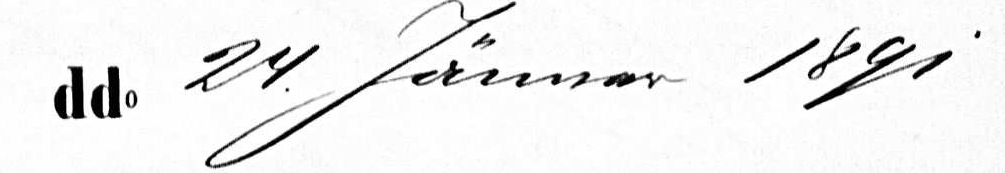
Ddo 24 Jänner 1891
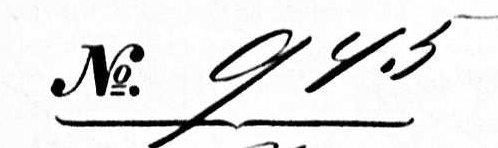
No 945
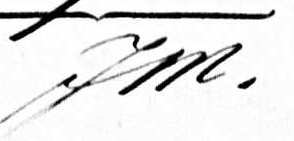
JM
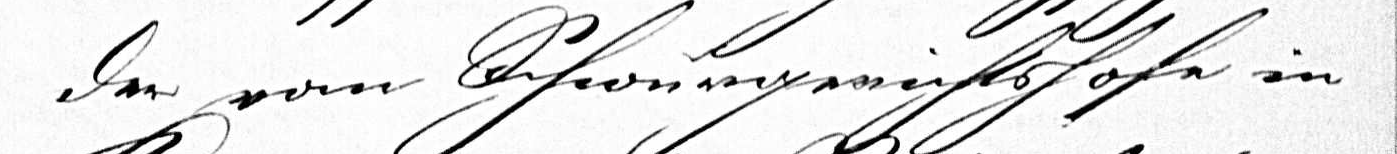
der vom Schwurgerichtshofe in
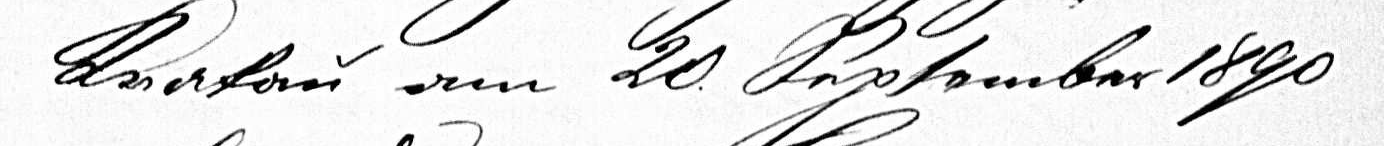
Krakau am 20 September 1890
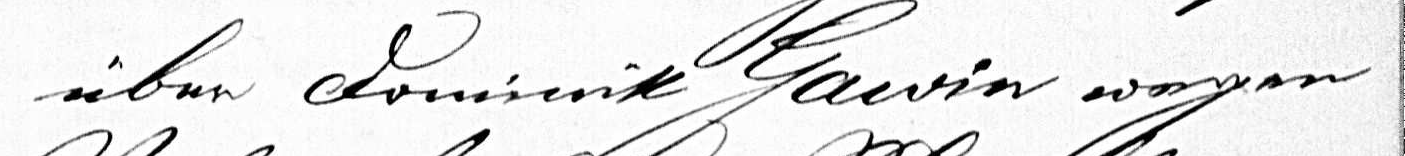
über Dominik Gawin wegen
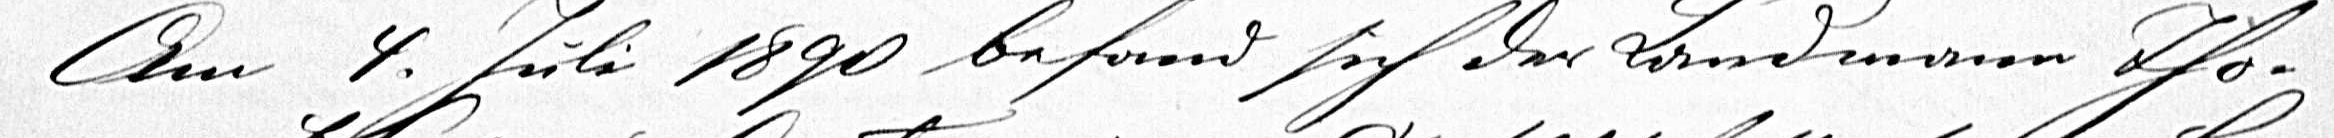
Am 4. Juli 1890 befand sich der Landmann Tho¬
